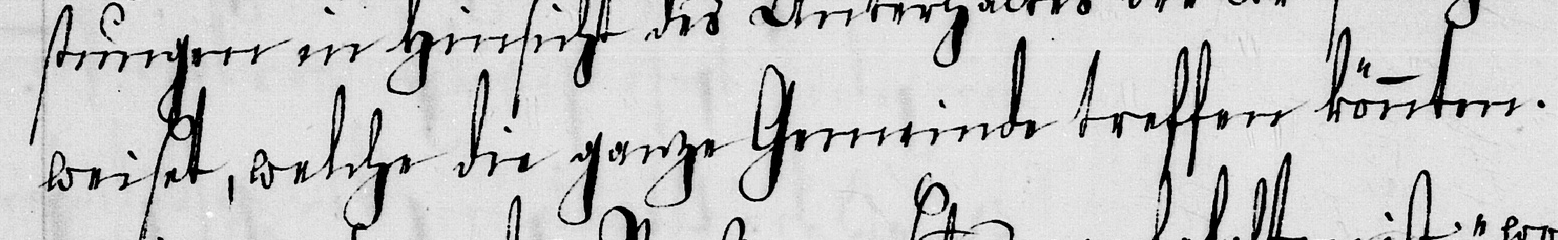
weiset, welche die ganze Gemeinde treffen könnten.
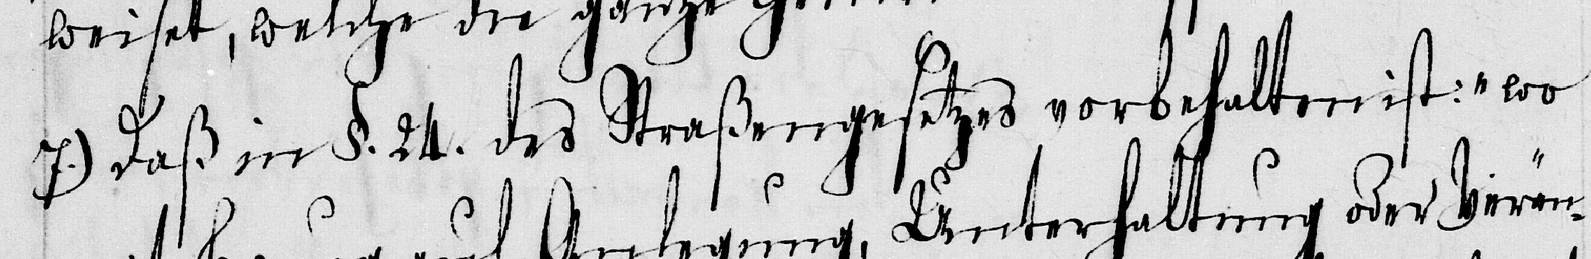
7.) Daß in §. 24. des Straßengesetzes vorbehalten ist: „wo
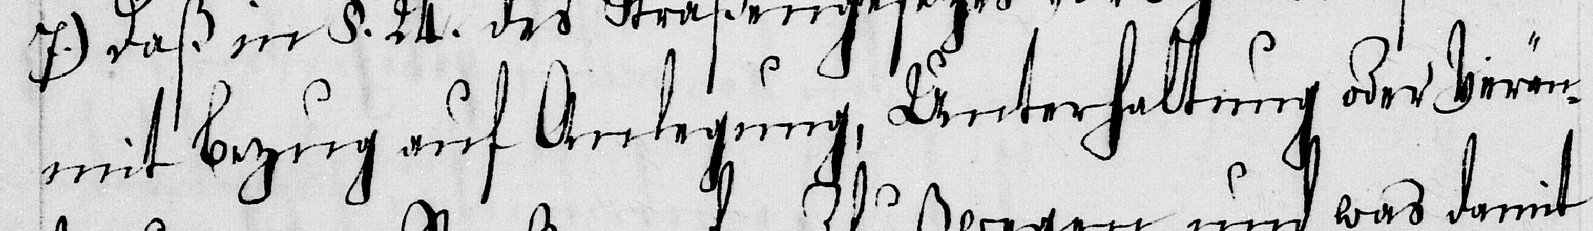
mit Bezug auf Anlegung, Unterhaltung oder Verän¬
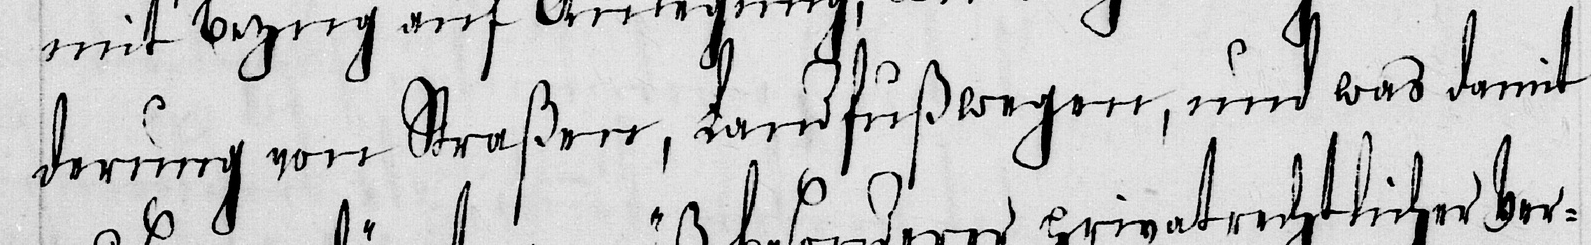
derung von Straßen, Landfußwegen, und was damit
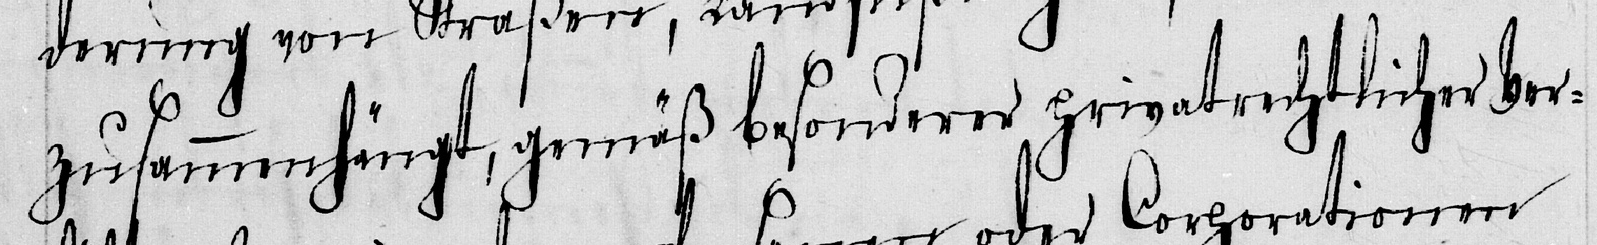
zusammenhängt, gemäß besonderer privatrechtlicher Ver¬
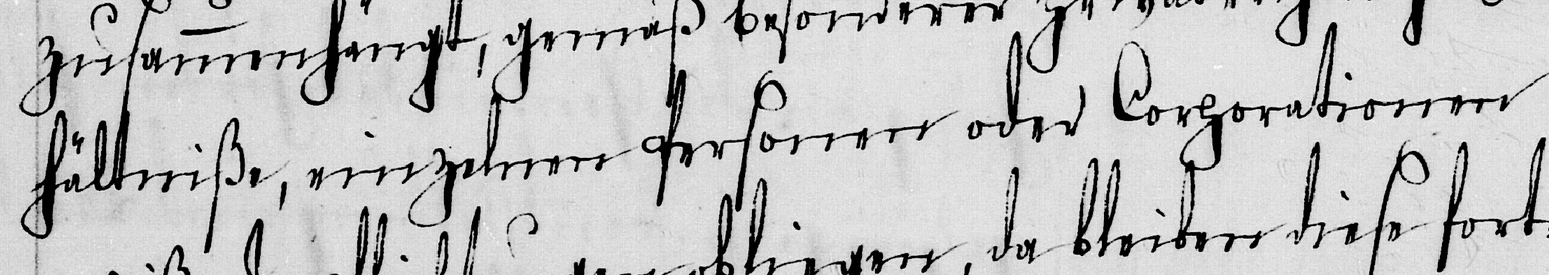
hältniße, einzelnen Personen oder Corporationen
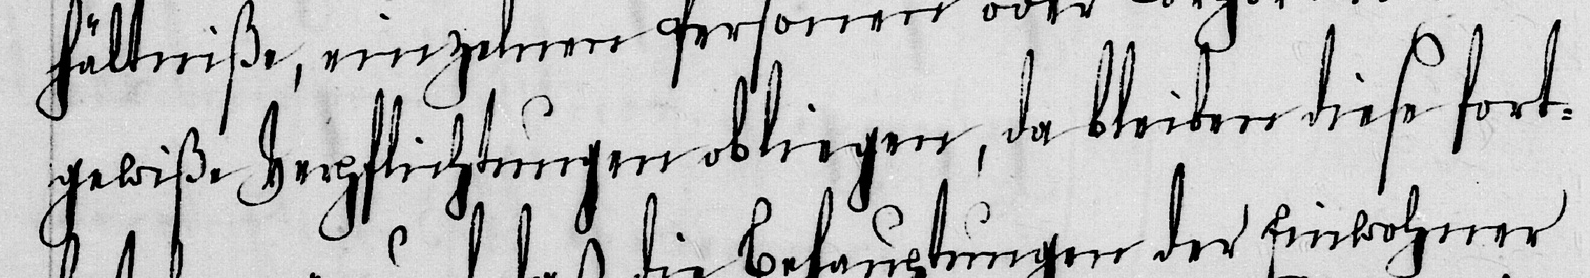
gewiße Verpflichtungen obliegen, da bleiben diese fort¬
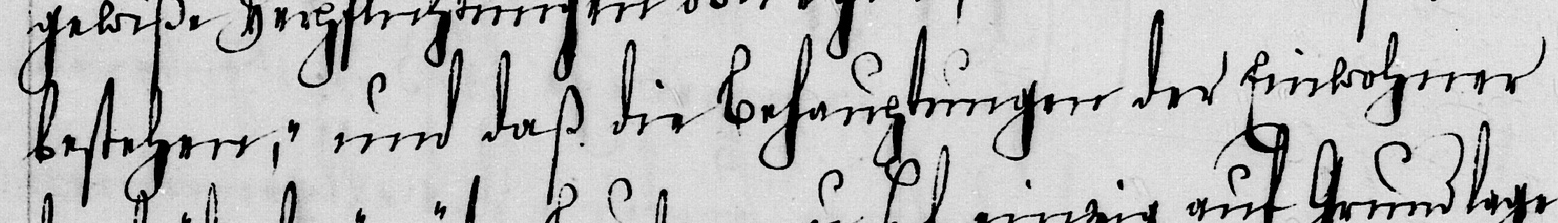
bestehen,“ und daß die Behauptungen der Einwohner
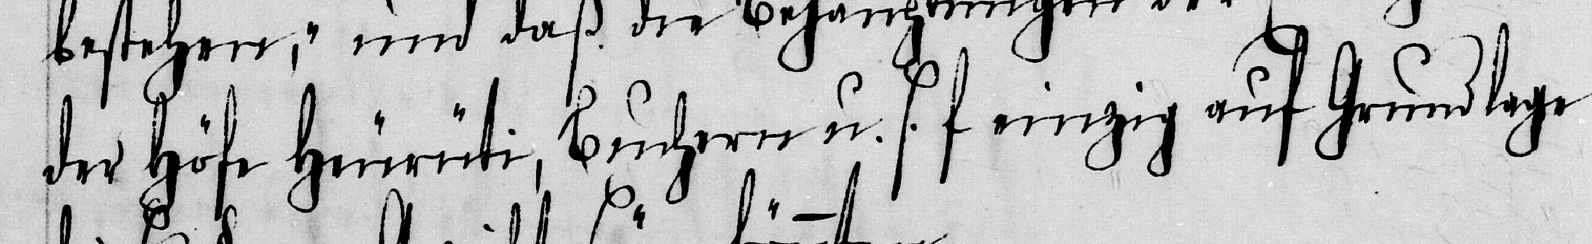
der Höfe Heurüti, Buchern u. s. w. einzig auf Grundlage
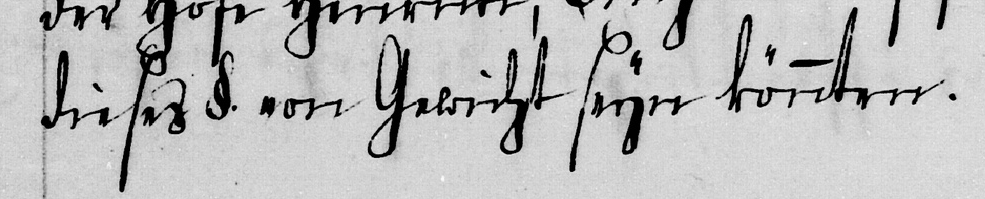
dieses §. von Gewicht seyn könnten.
